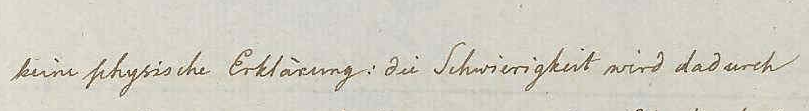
keine physische Erklärung: die Schwierigkeit wird dadurch
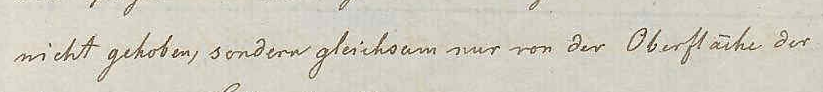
nicht gehoben, sondern gleichsam nur von der Oberfläche der
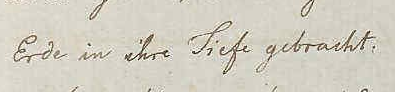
Erde in ihre Tiefe gebracht.
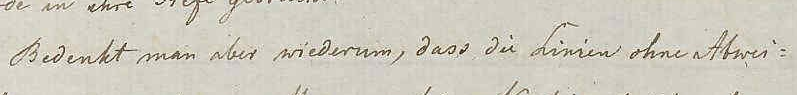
Bedenkt man aber wiederum, dass die Linien ohne Abwei-
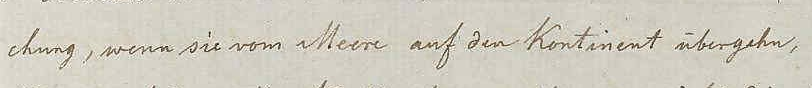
chung, wenn sie vom Meere auf den Kontinent übergehn,
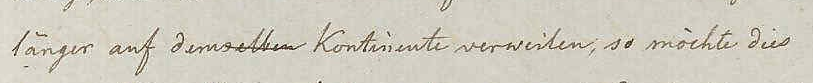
länger auf demselben Kontinente verweilen, so möchte dies
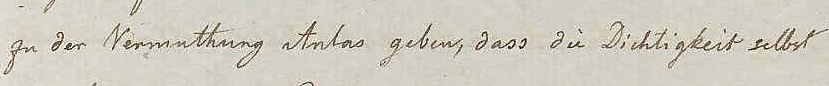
zu der Vermuthung Anlas geben, dass die Dichtigkeit selbst
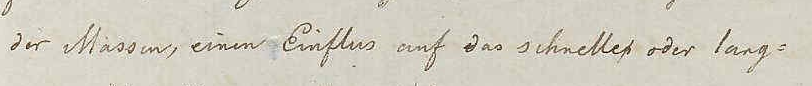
der Massen, einen Einflus auf das schnelles oder lang-
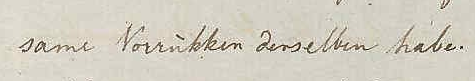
same Vorrükken derselben habe.
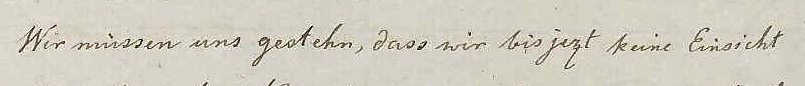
Wir müssen uns gestehn, dass wir bis jezt keine Einsicht
